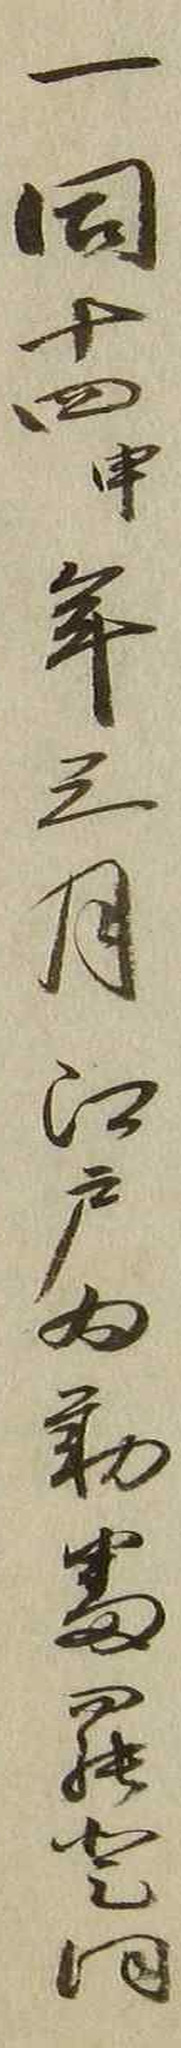一同十四申年三月江戸為勤番罷登同
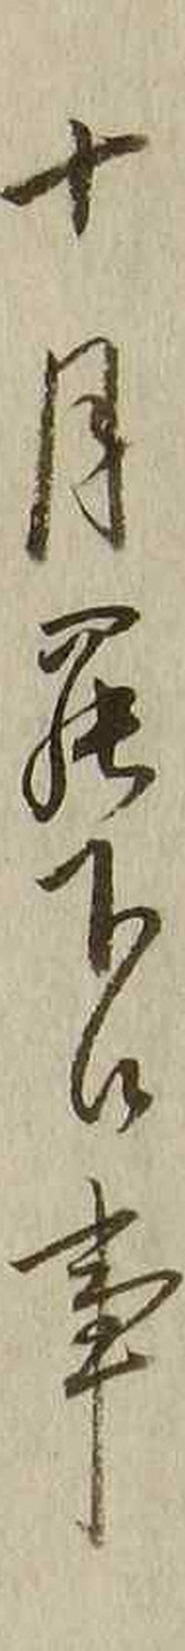十月罷下候事
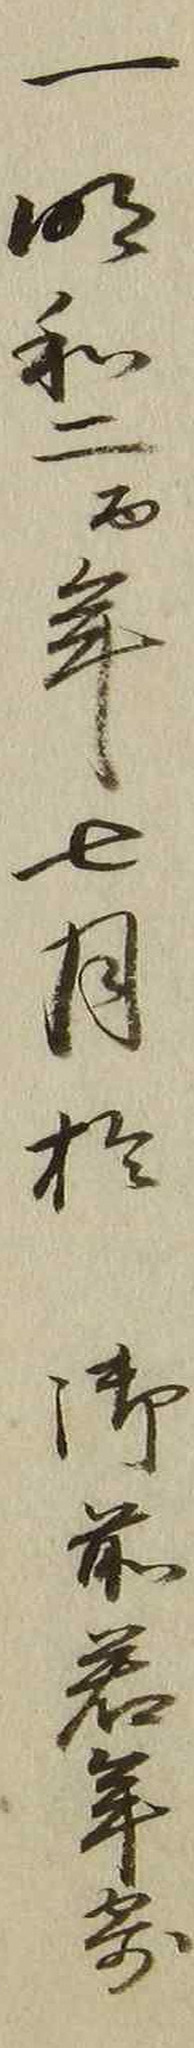一明和二酉年七月於御前若年寄
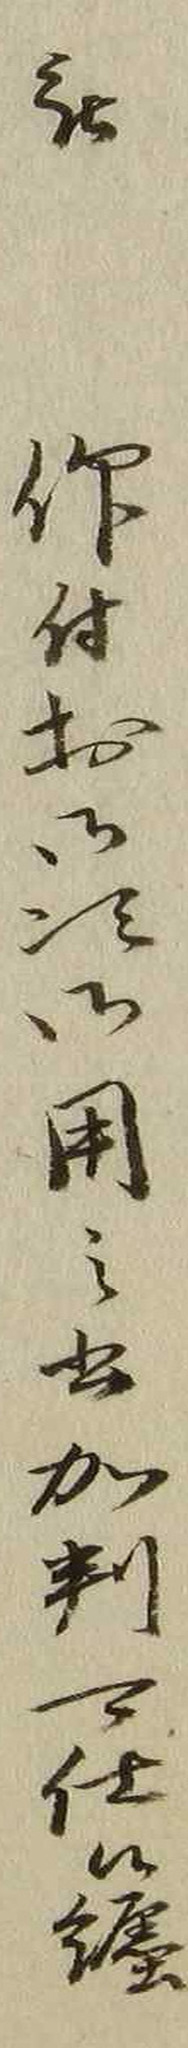被仰付於御次御用之書加判可仕候纏
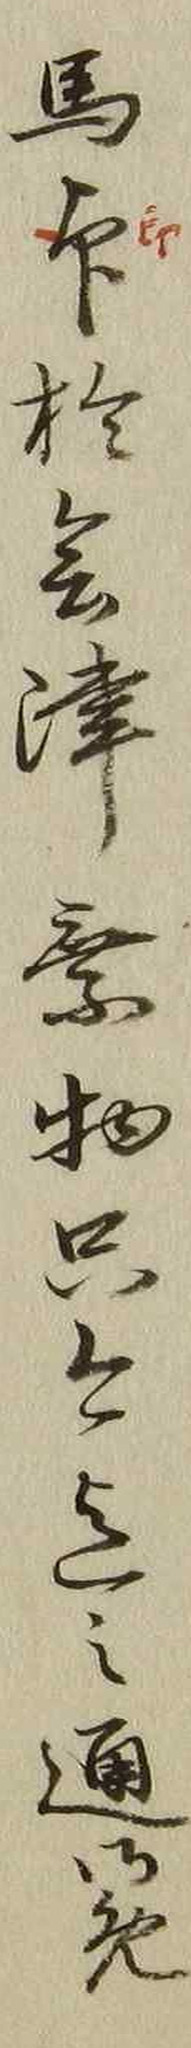馬印於会津乗物只今迄之通御免
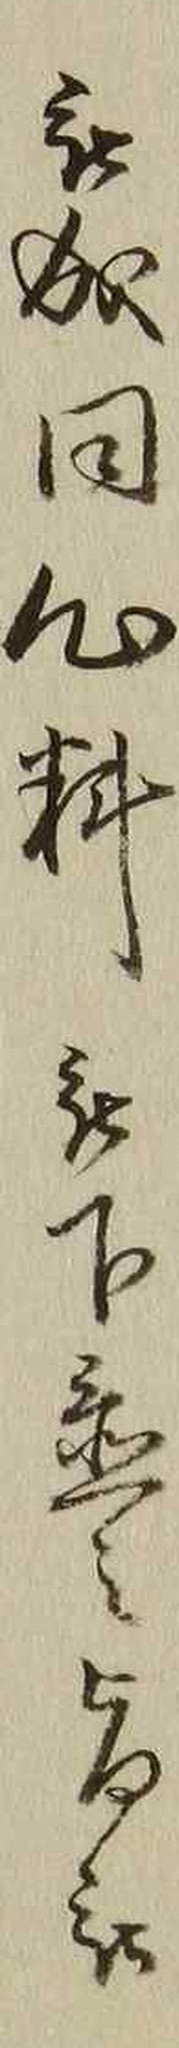被成同心料被下置之旨被
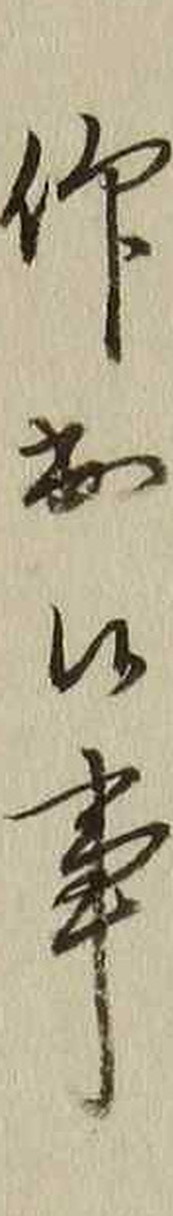仰出候事
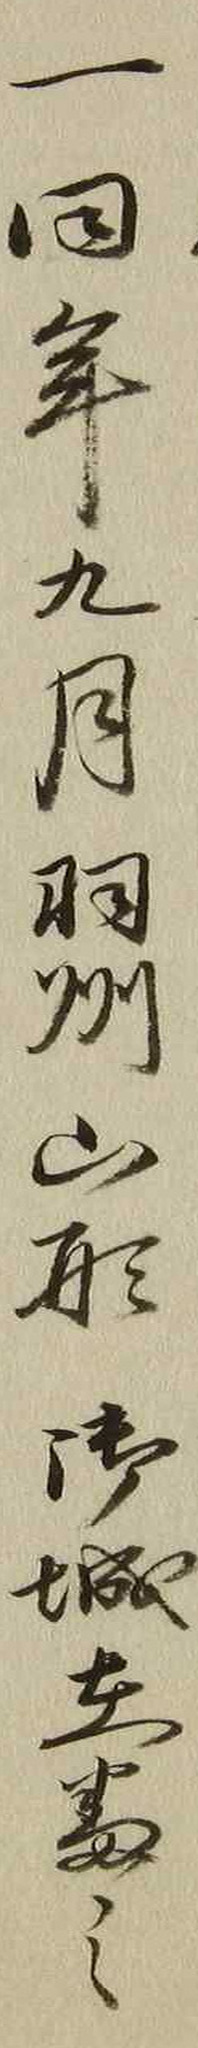一同年九月羽州山形御城在番之
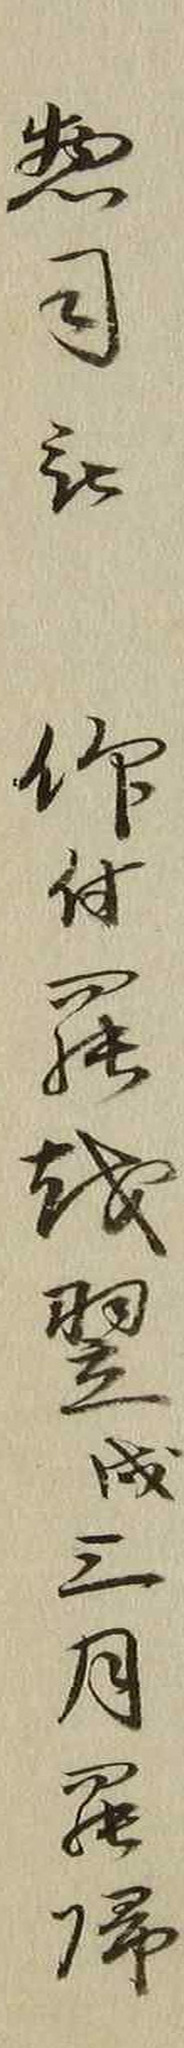惣司被仰付罷越翌戌三月罷帰
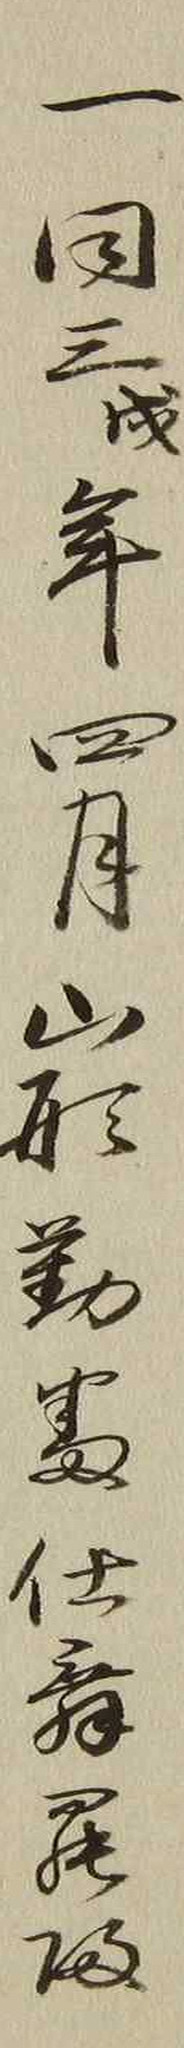一同三戌年四月山形勤番仕舞罷帰
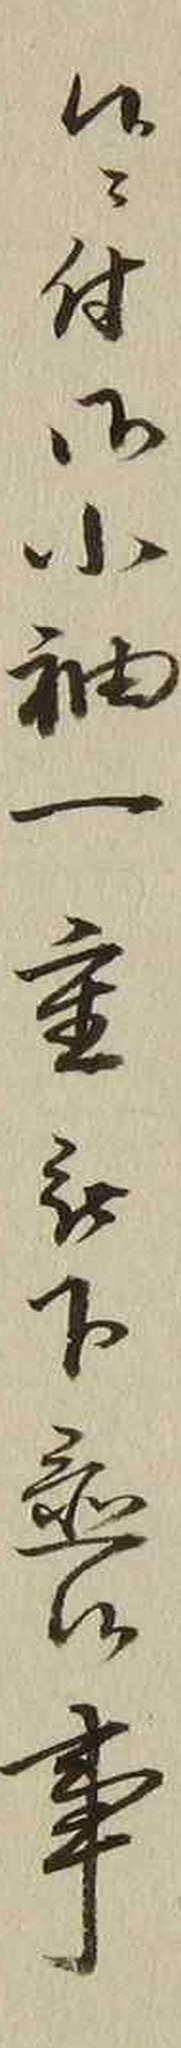候に付御小袖一重被下置候事
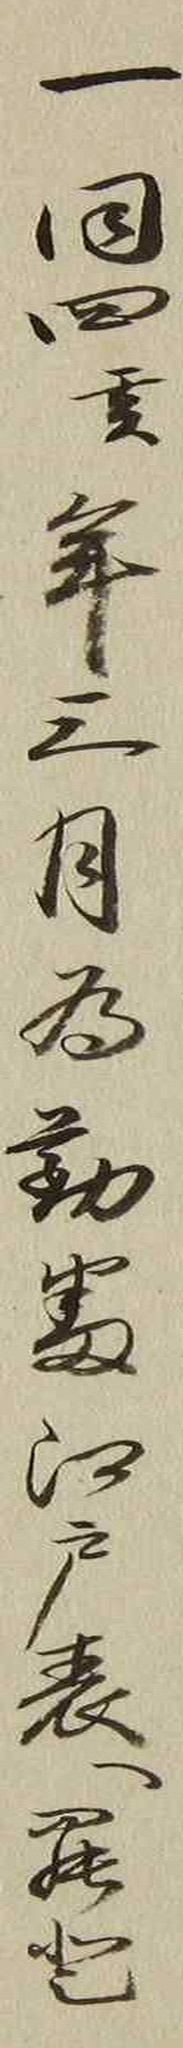一同四亥年三月為勤番江戸表へ罷登
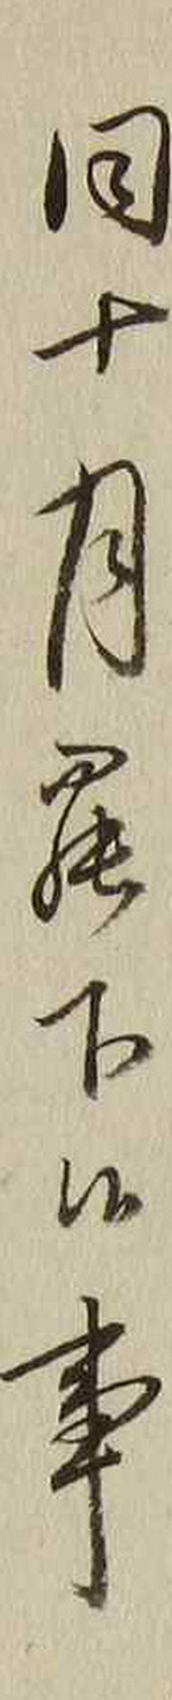同十月罷下候事
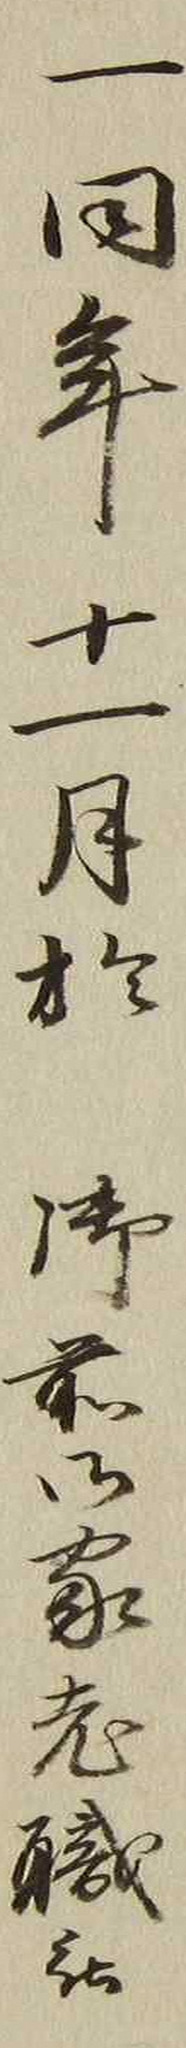一同年十一月於御前御家老職被
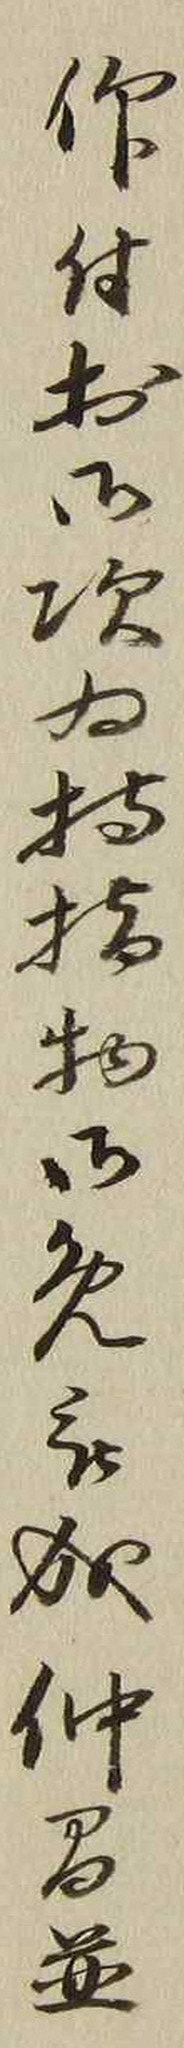仰付於御次為持指物御免被成仲間並
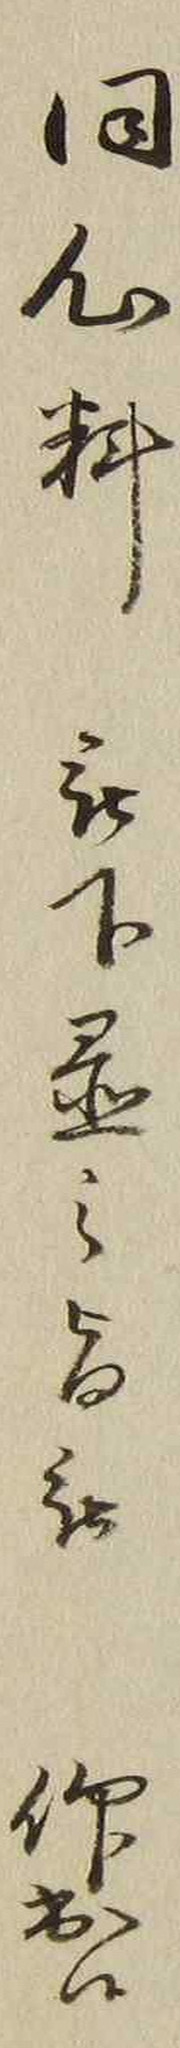同心料被下置之旨被仰出候
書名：諸士系譜　巻之133　た之部9
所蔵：会津若松市立会津図書館
